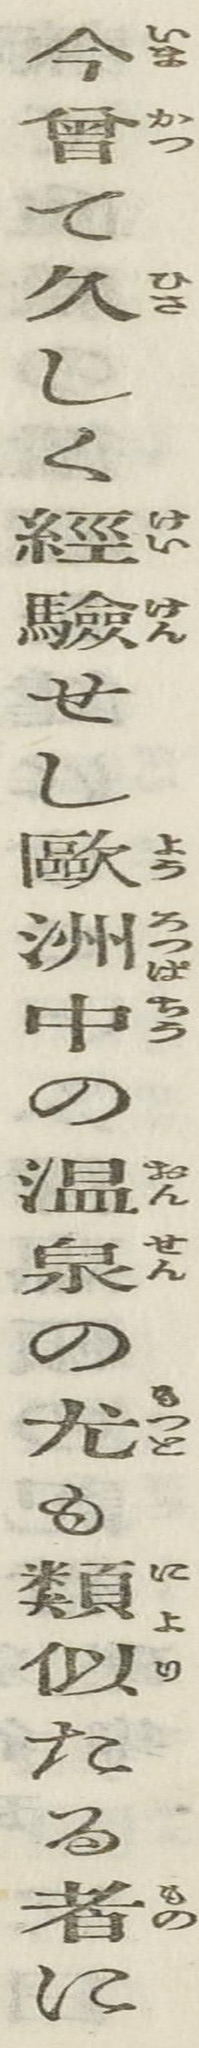今曾て久しく経験せし欧洲中の温泉の尤も類似たる者に
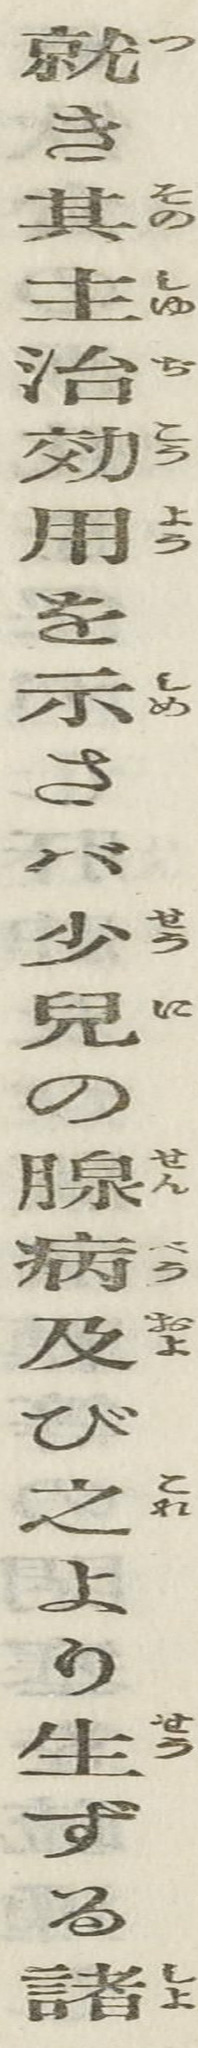就き其主治効用を示さば少兒の腺病及び之より生ずる諸
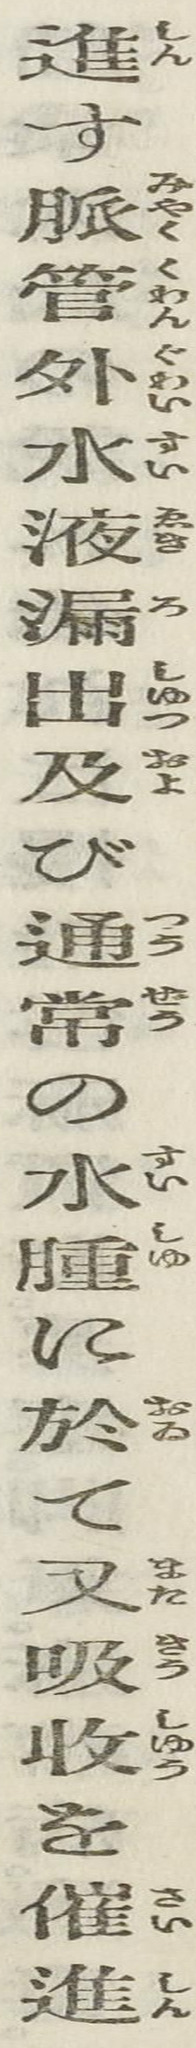進す脈管外水液漏出及び通常の水腫に於て又吸収を催進
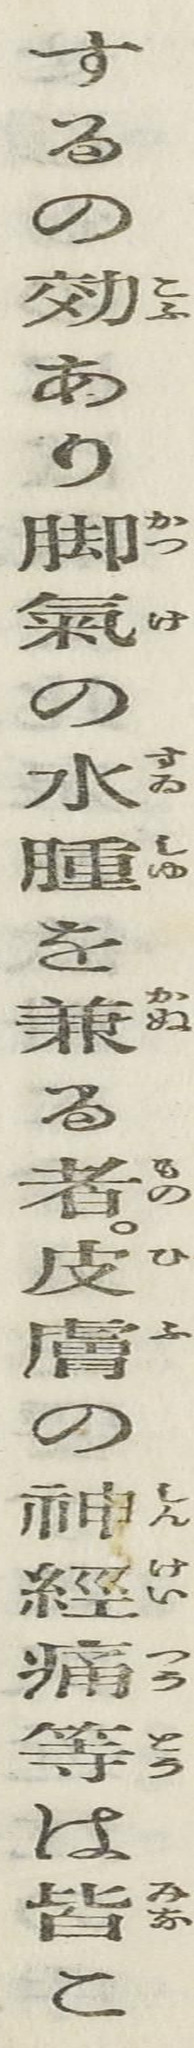するの効あり脚氣の水腫を兼る者。皮膚の神経痛等は皆こ
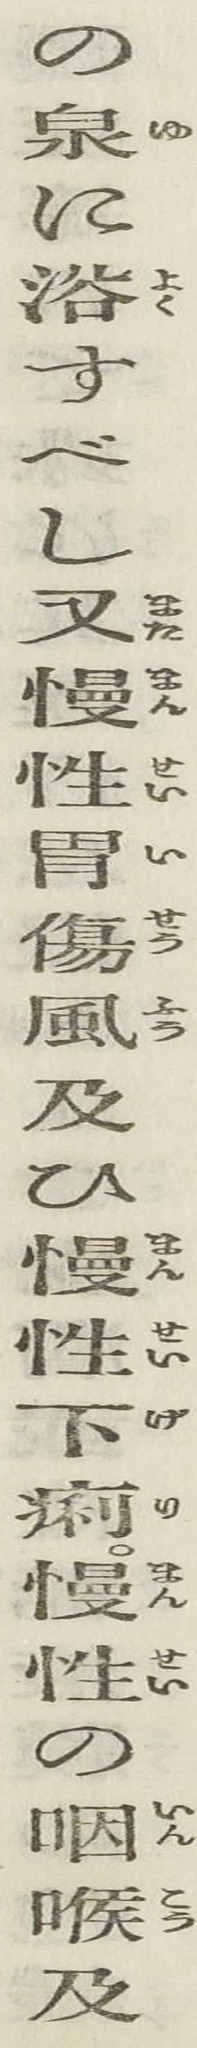の泉に浴すべし又慢性胃傷風及ひ慢性下痢。慢性の咽喉及

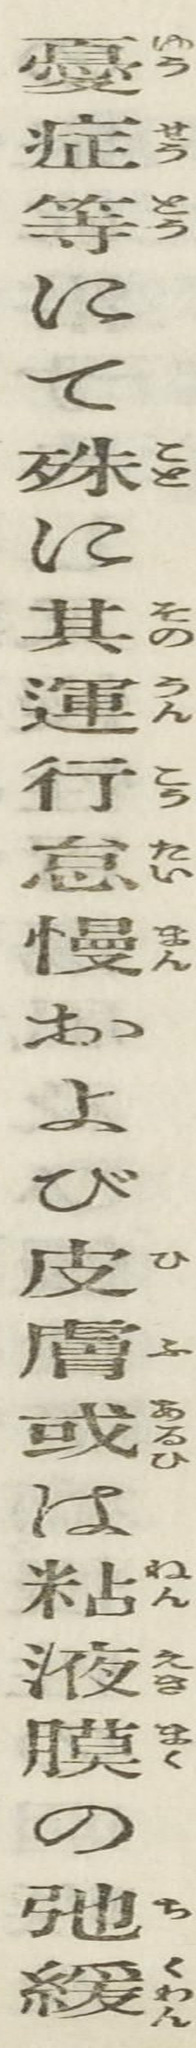憂症等にて殊に其運行怠慢および皮膚或は粘液膜の弛緩
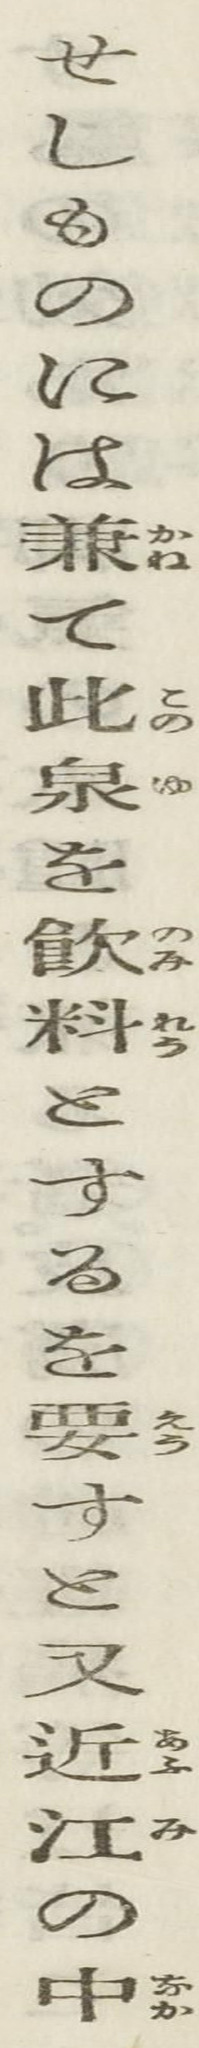せしものには兼て此泉を飲料とするを要すと又近江の中
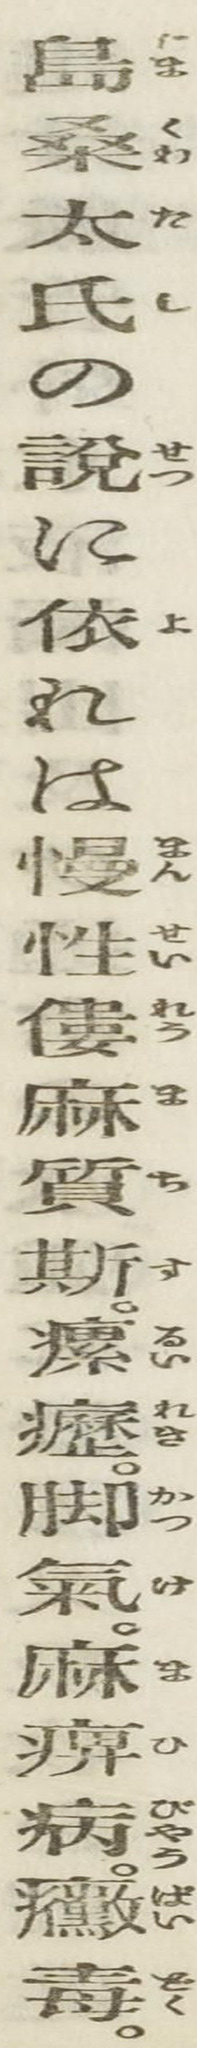島桑太氏の説に依れは慢性僂麻質斯。瘰癧。脚氣。麻痺病。黴毒。
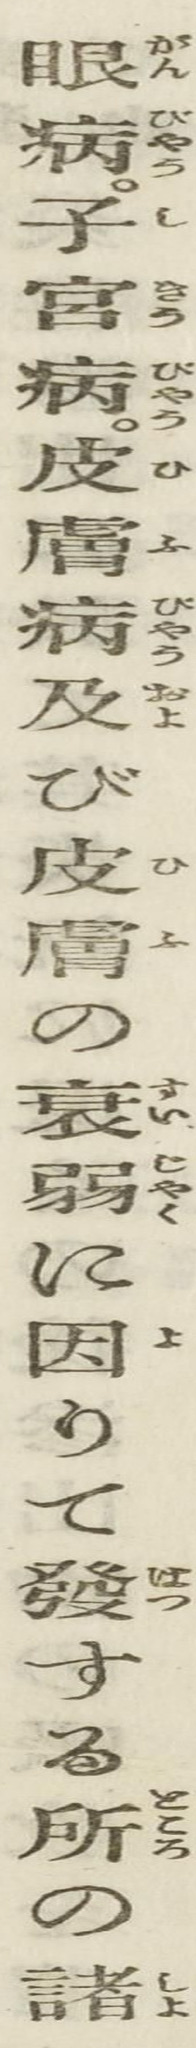眼病。子宮病。皮膚病及び皮膚の衰弱に因りて発する所の諸
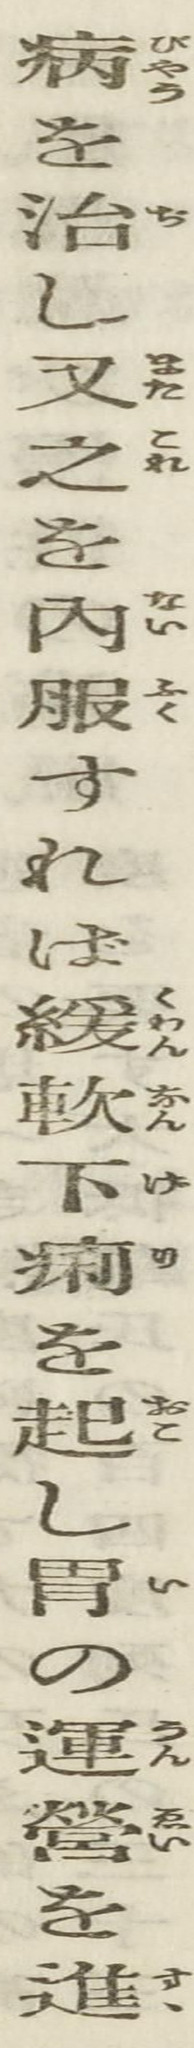病を治し又之を内服すれば緩軟下痢を起し胃の運営を進
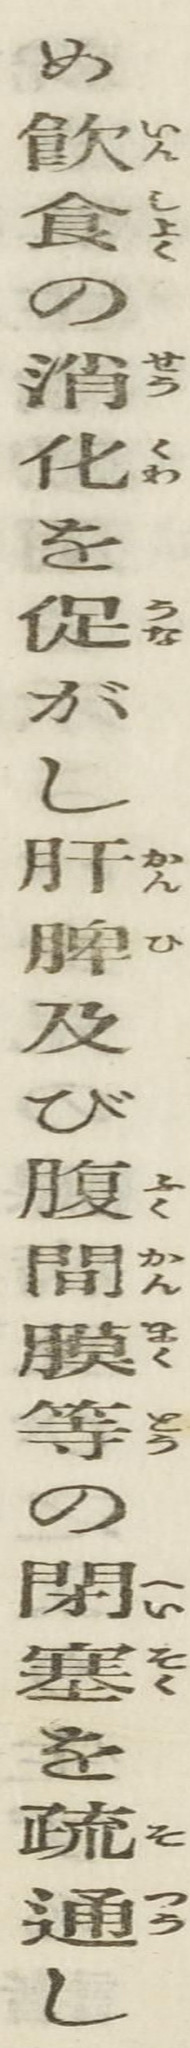め飲食の消化を促がし肝脾及び腹間膜等の閉塞を疎通し
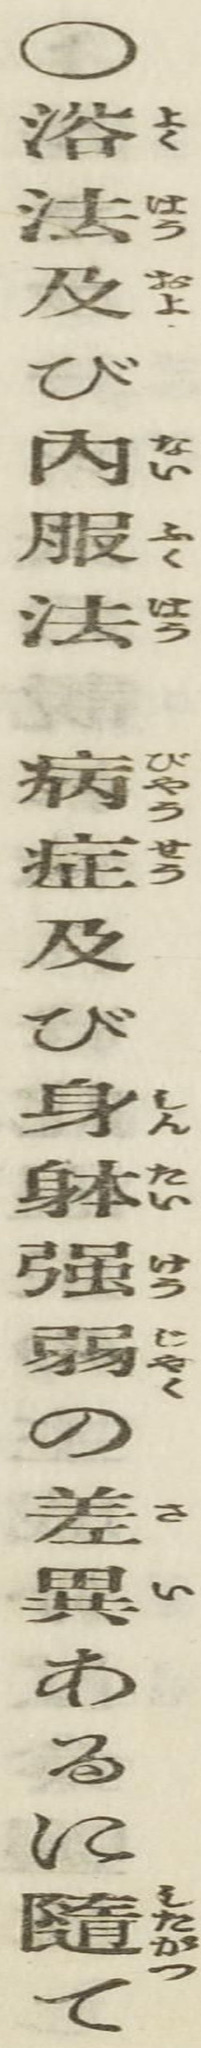○浴法及び内服法病症及び身躰強弱の差異あるに随て
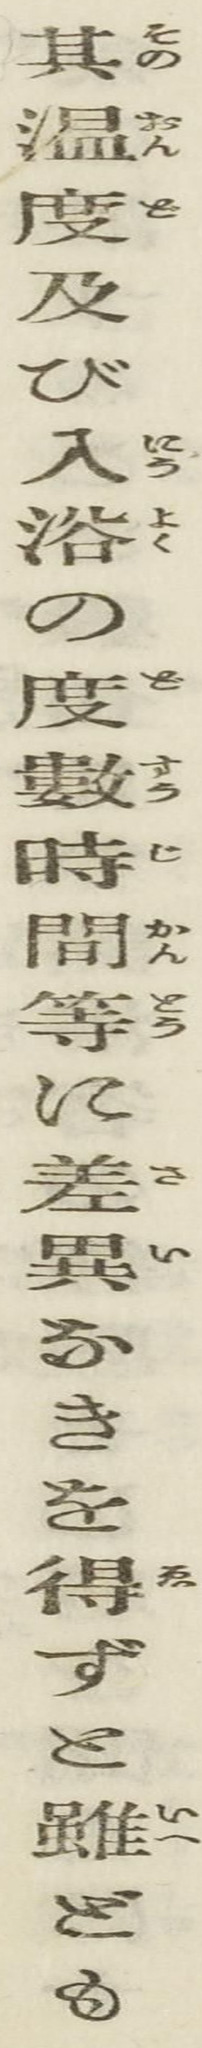其温度及び入浴の度数時間等に差異なきを得ずと雖ども
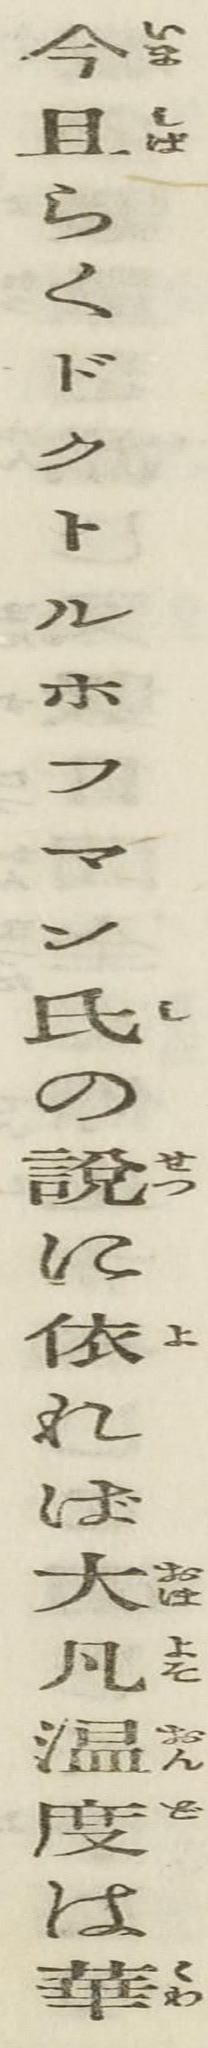今且らくドクトルホフマン氏の説に依れば大凡温度は華
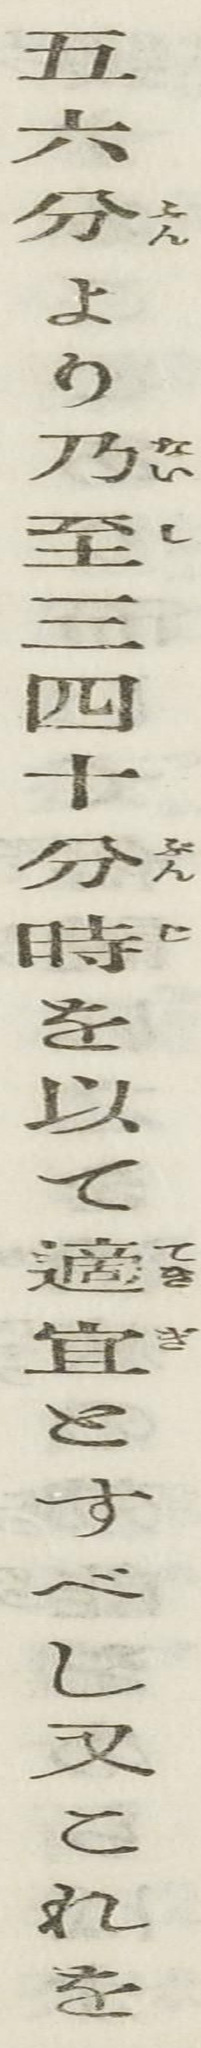五六分より乃至三四十分時を以て適宜とすべし又これを
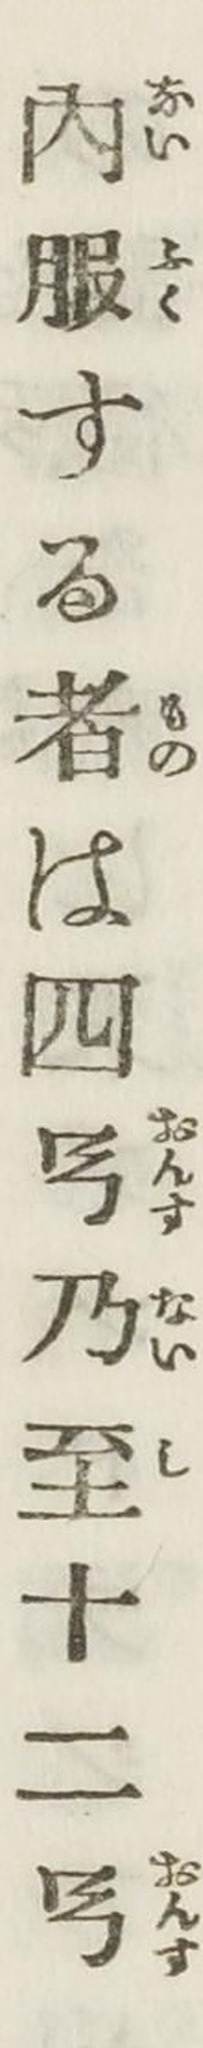内服する者は四℥乃至十二℥
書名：熱海獨案内　全
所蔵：東京大学地震研究所図書室 Earthquake Research Institute Library, The University of Tokyo, JAPAN
